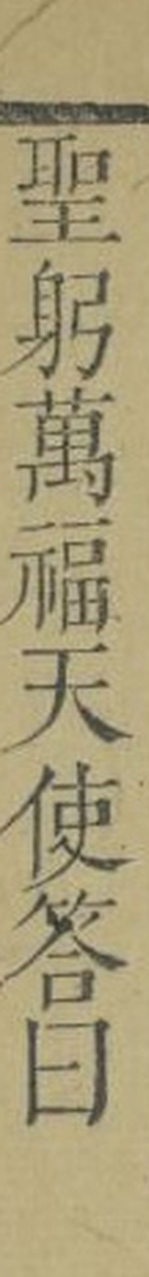聖躬萬福天使答曰
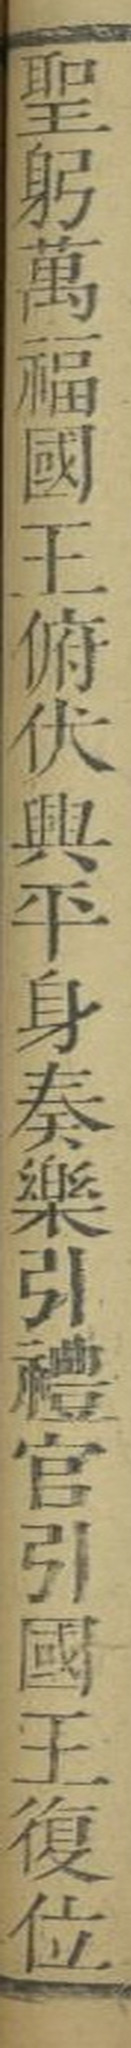聖躬萬福國王俯伏興平身奏樂引禮官引國王復位
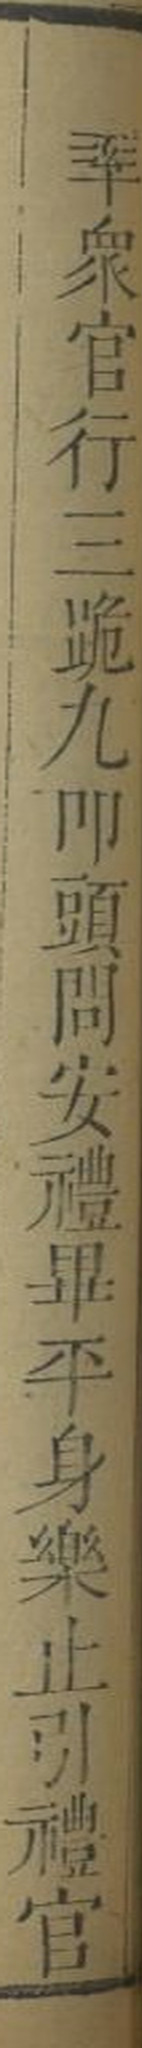率衆官行三跪九叩頭問安禮畢平身樂止引禮官
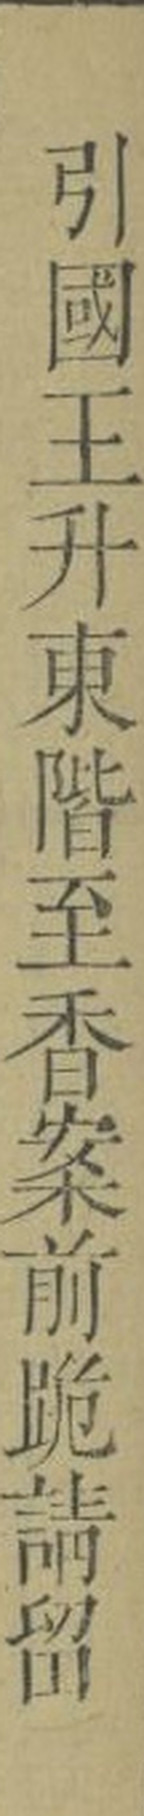引國王升東階至香案前跪請留
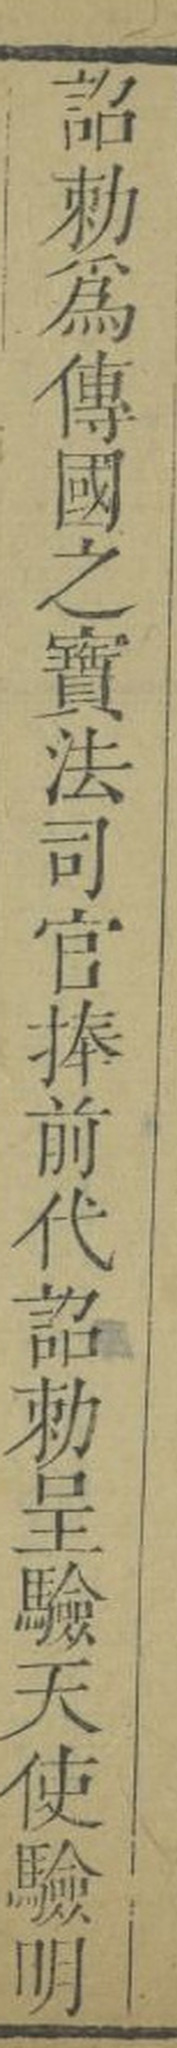詔勅爲傳國之寶法司官捧前代詔勅呈驗天使驗明
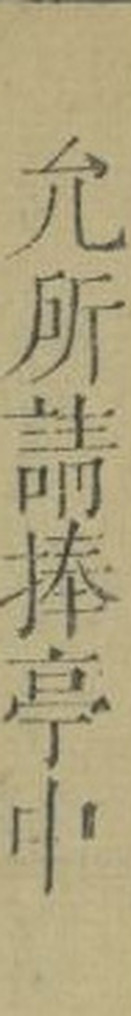允所請捧亭中
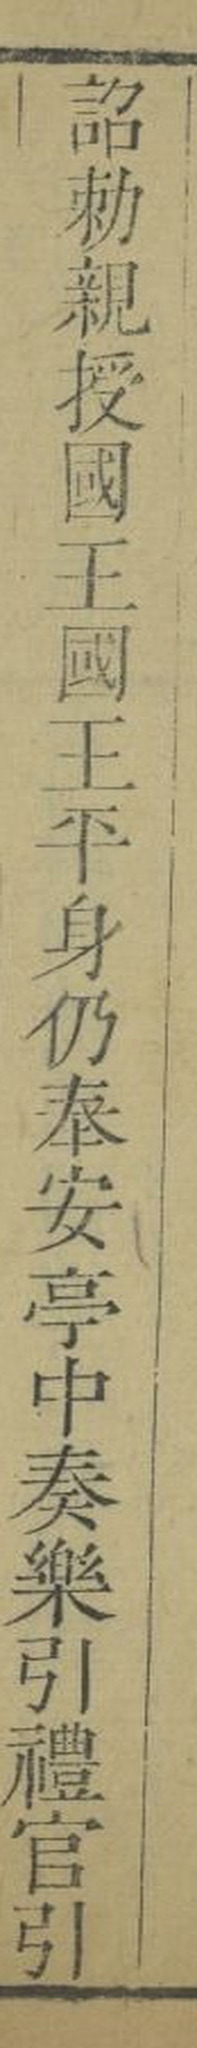詔勅親授國王國王平身仍奉安亭中奏樂引禮官引
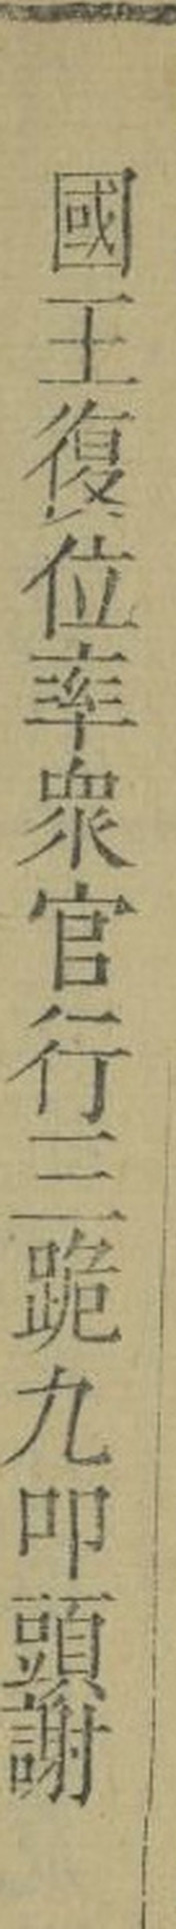國王復位率衆官行三跪九叩頭謝
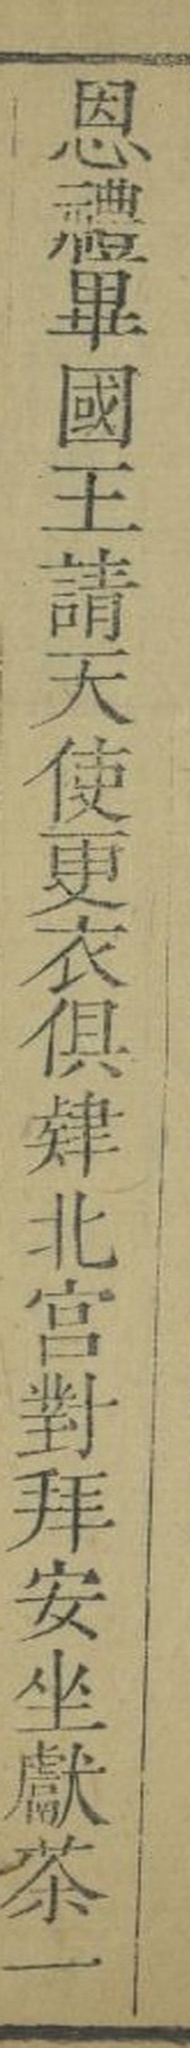恩禮畢國王請天使更衣倶肄北宫對拜安坐獻茶一
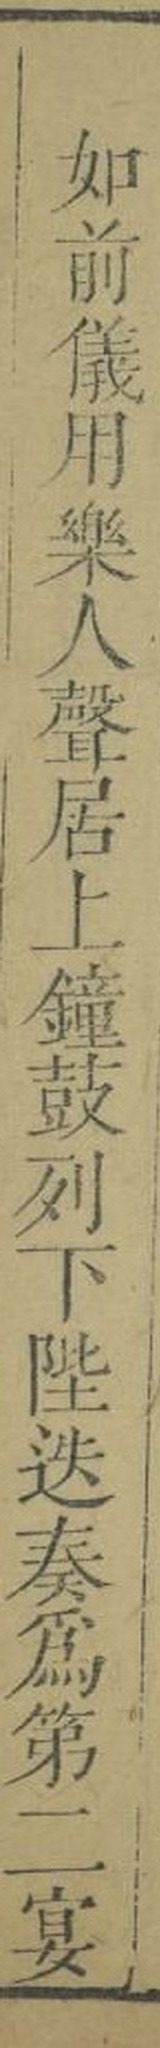如前儀用樂人聲居上鐘鼓列下陛迭奏爲第二宴
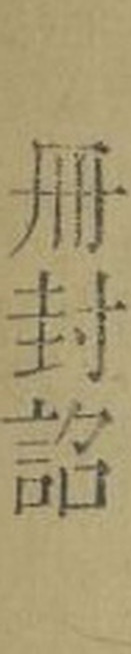冊封詔

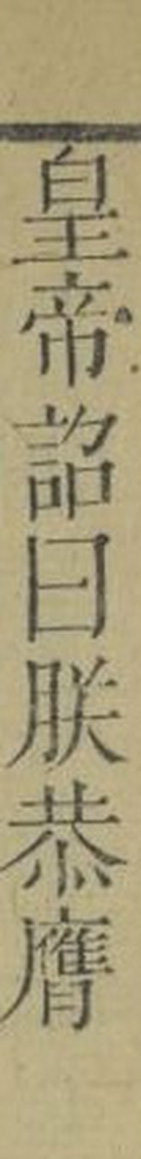皇帝詔曰朕恭膺
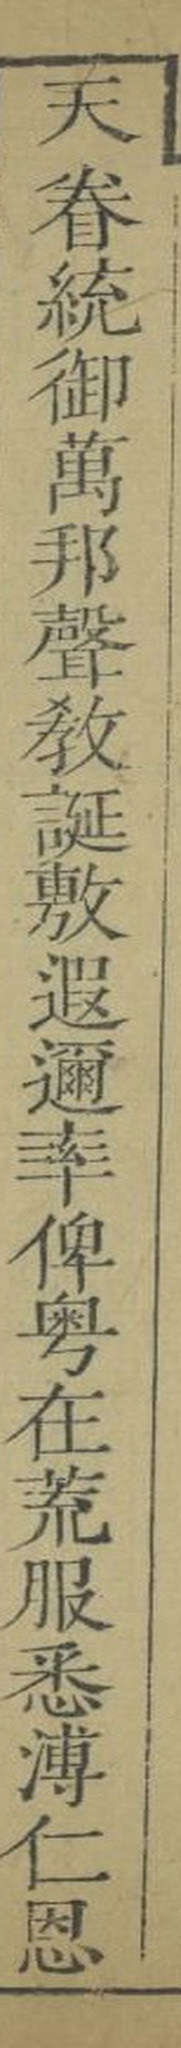天眷統御萬邦聲敎誕敷遐邇率俾粤在荒服悉溥仁恩
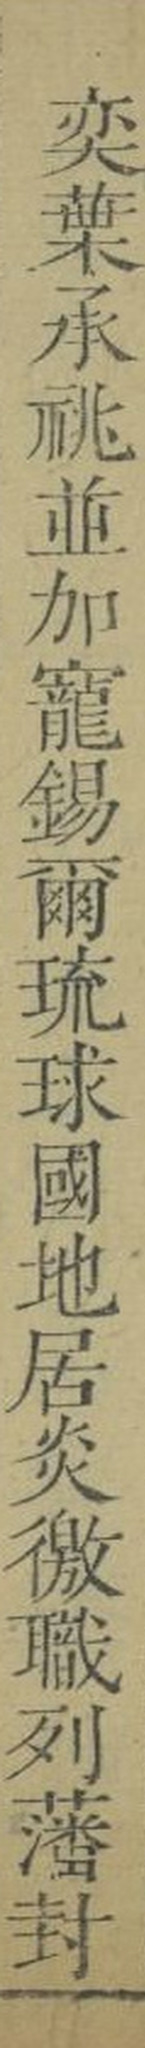奕葉承祧並加寵錫爾琉球國地居炎徼職列藩封
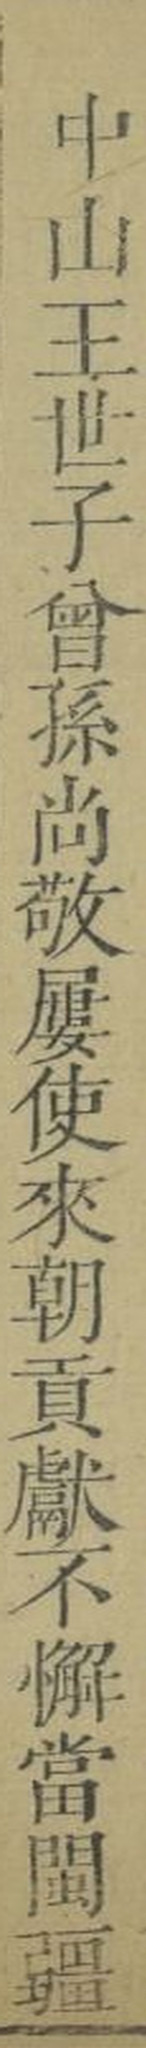中山王世子曾孫尚敬屢使來朝貢獻不懈當閩疆
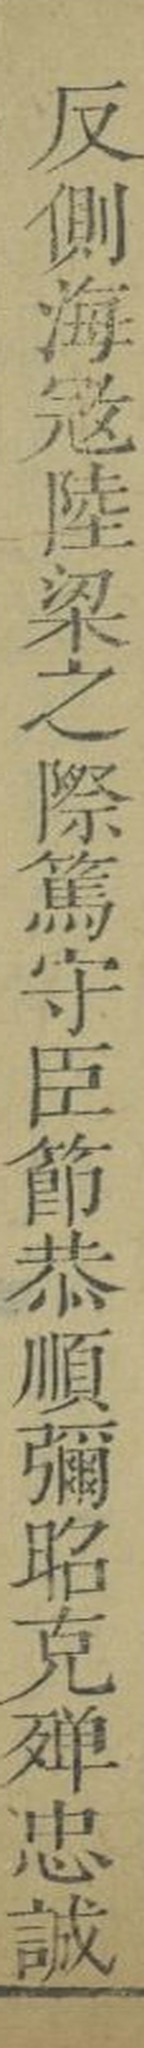反側海冦陸梁之際篤守臣節恭順彌昭克殚忠誠
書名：中山伝信録 巻二
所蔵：University of the Ryukyus Library
